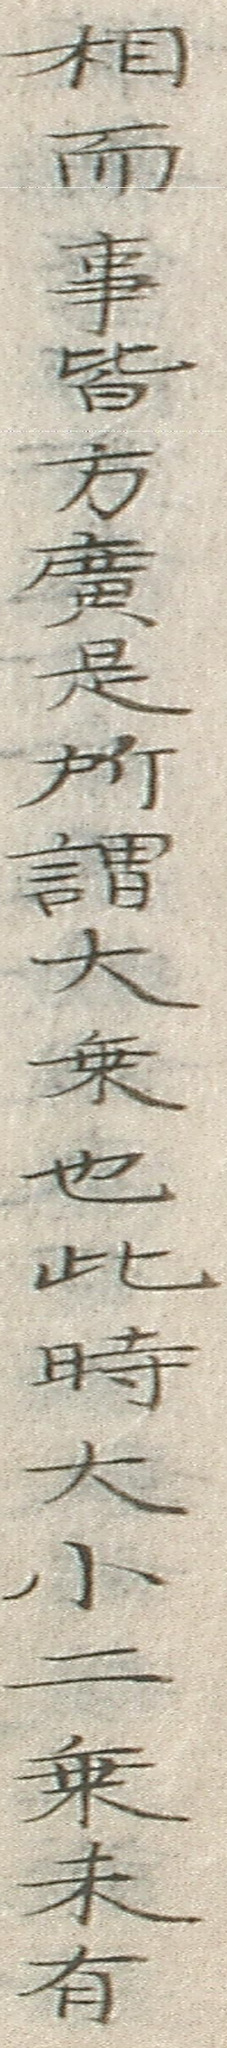相而事皆方広是所謂大乗也此時大小二乗未有
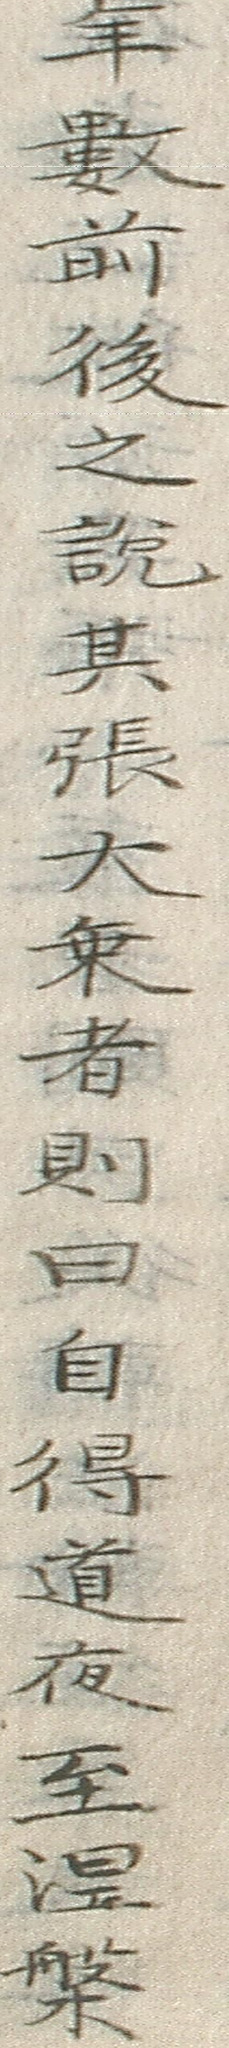年数前後之説其張大乗者則曰自得道夜至涅槃

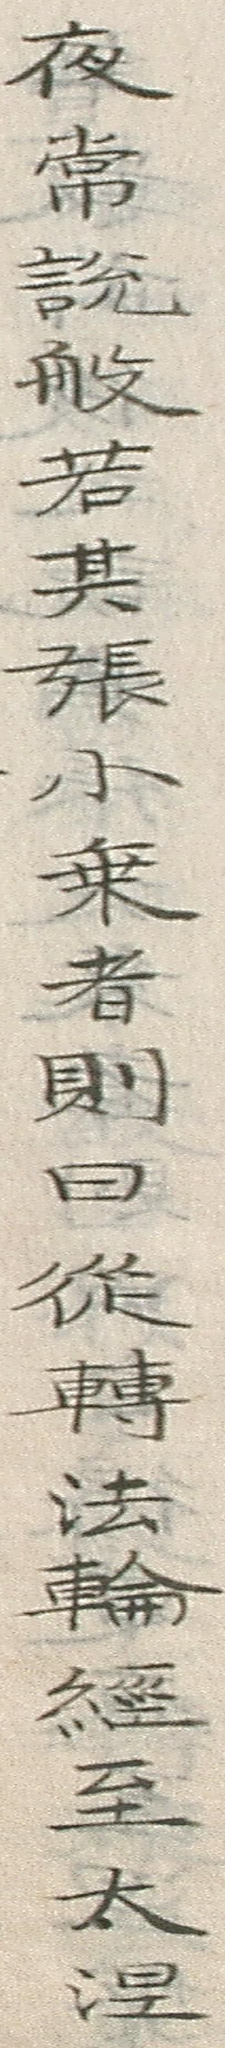夜常説般若其張小乗者則曰従転法輪経至大涅
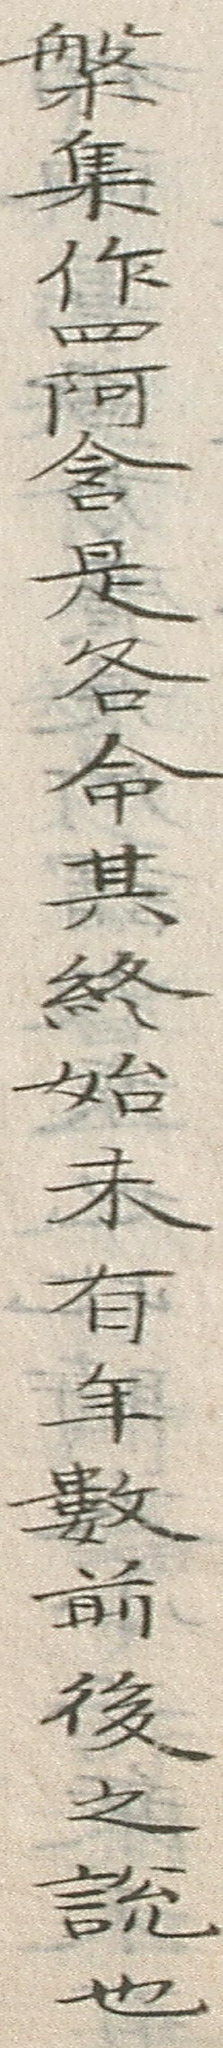槃集作四阿含是各命其終始未有年数前後之説也
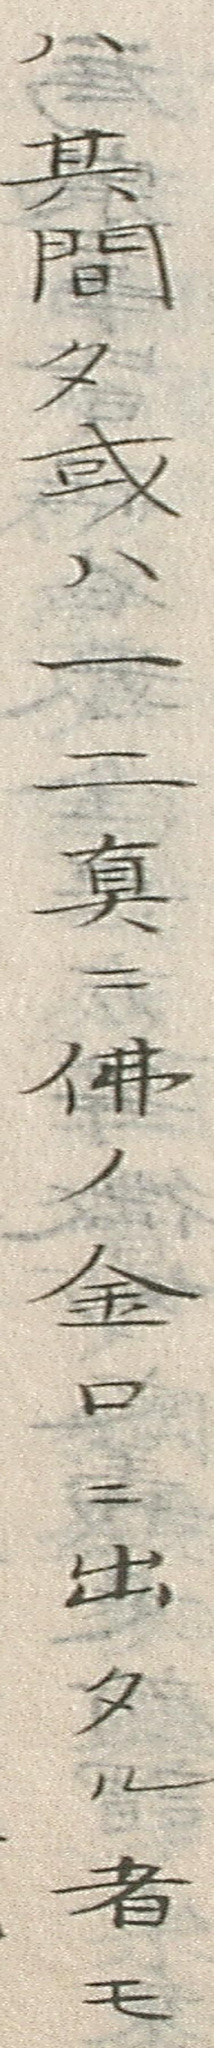ハ其間タ或ハ一二真ニ仏ノ金口ニ出タル者モ
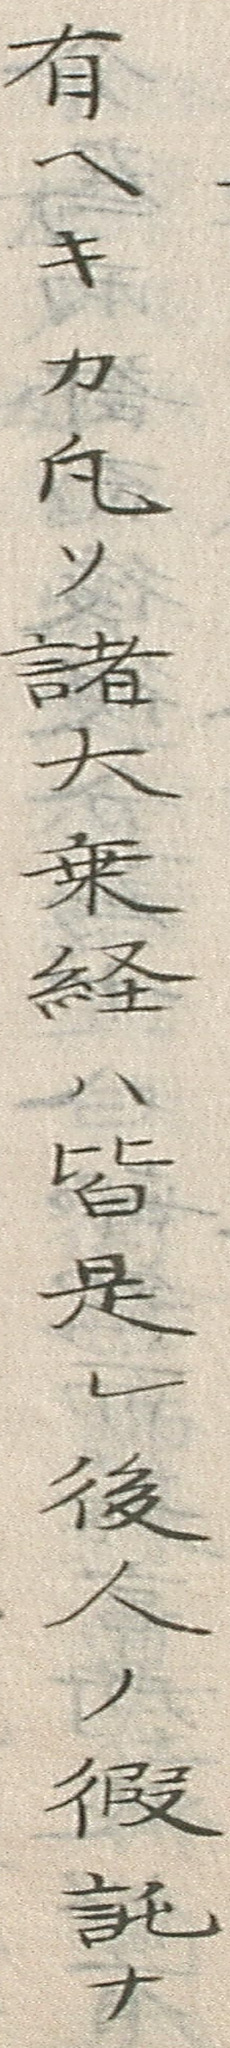有ヘキカ凡ソ諸大乗経ハ皆是レ後人ノ仮託ナ
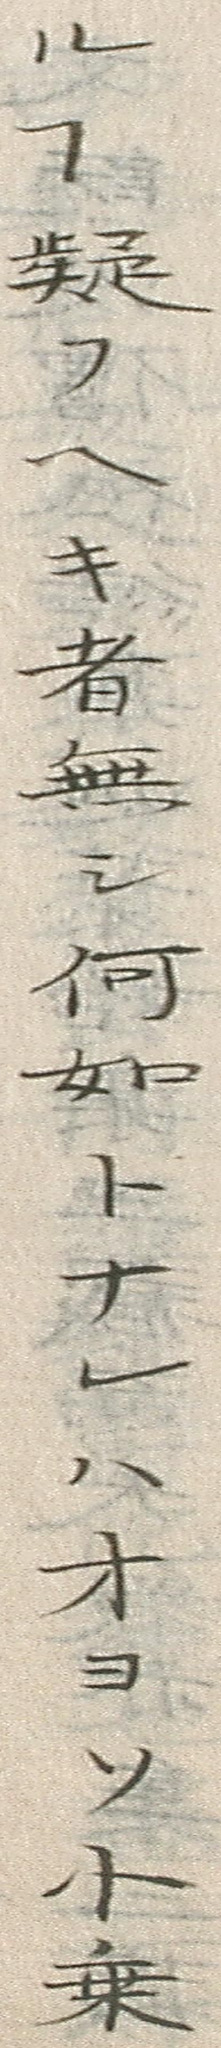ルコト疑フヘキ者無シ何如トナレハオヨソ小乗
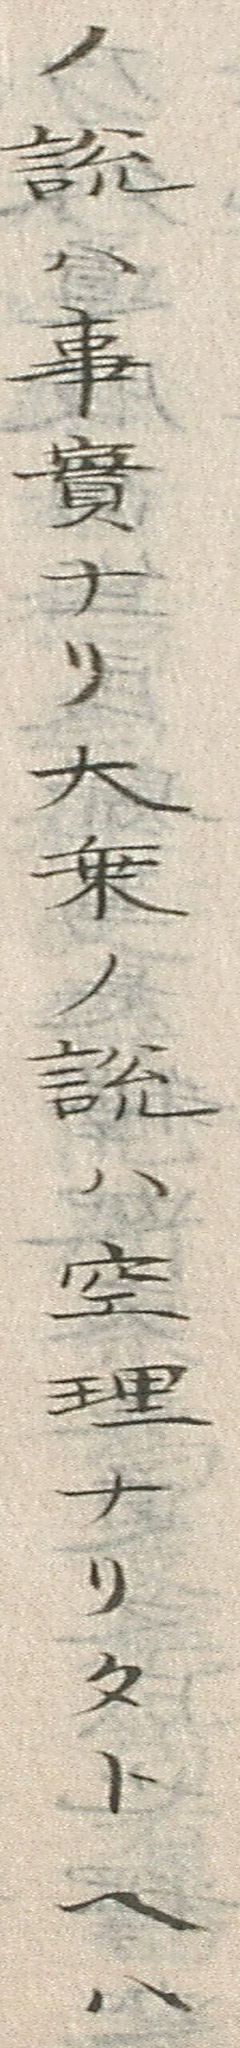ノ説ハ事実ナリ大乗ノ説ハ空理ナリタトヘハ
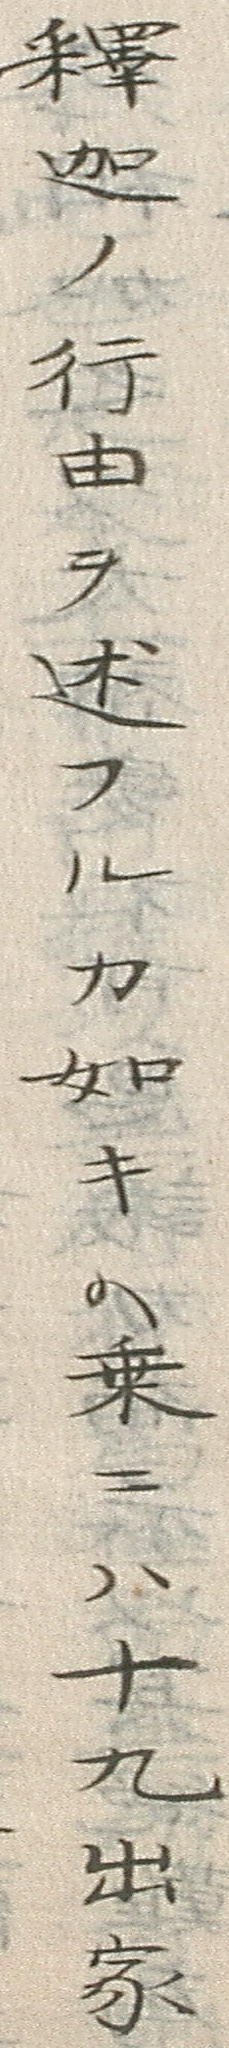釈迦ノ行由ヲ述フルカ如キハ乗ニハ十九出家
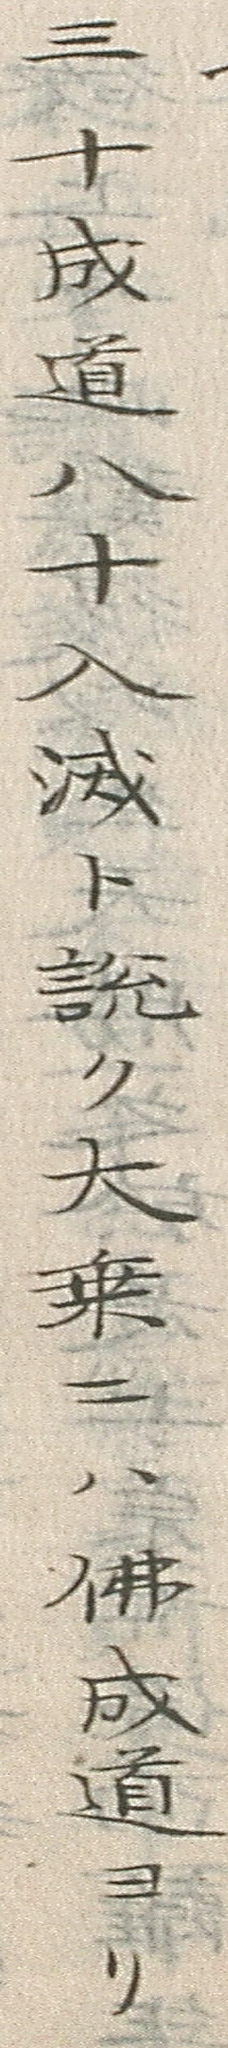三十成道八十入滅ト説ク大乗ニハ仏成道ヨリ
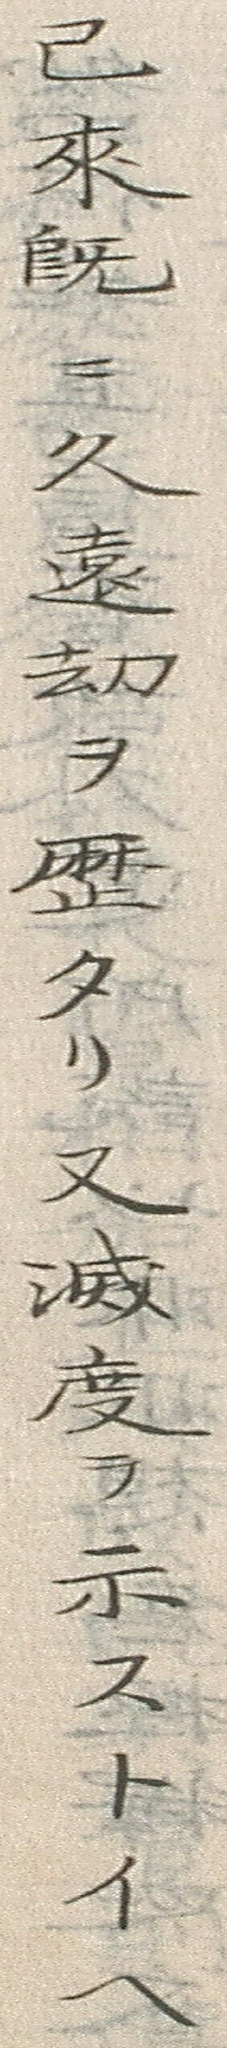己来既ニ久遠劫ヲ歴タリ又滅度ヲ示ストイヘ
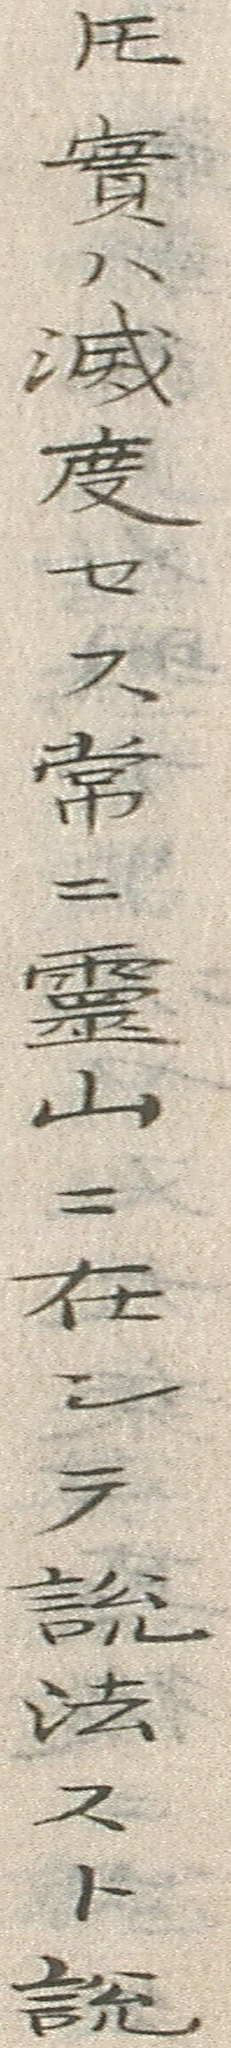トモ実ハ滅度セス常ニ霊山ニ在シテ説法スト説
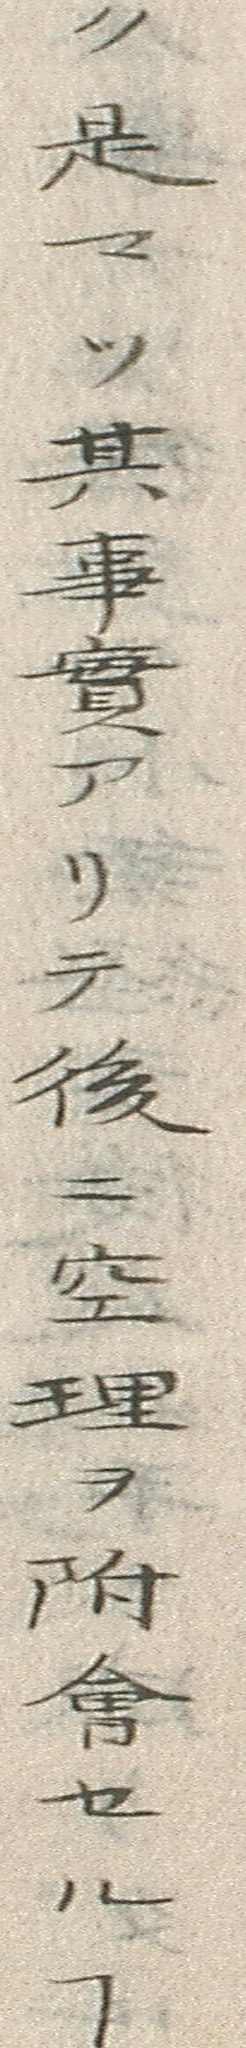ク是マツ其事実アリテ後ニ空理ヲ付会セルコト
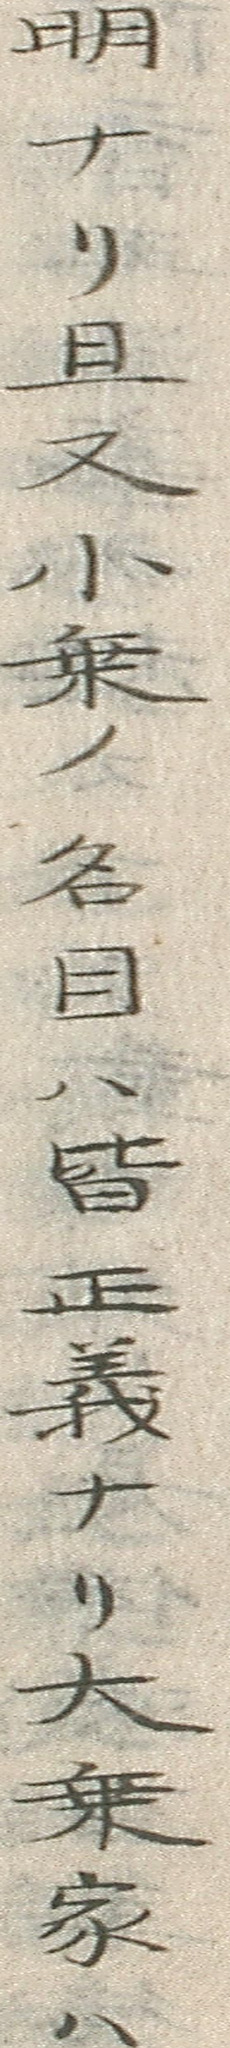明ナリ且又小乗ノ名目ハ皆正義ナリ大乗家ハ
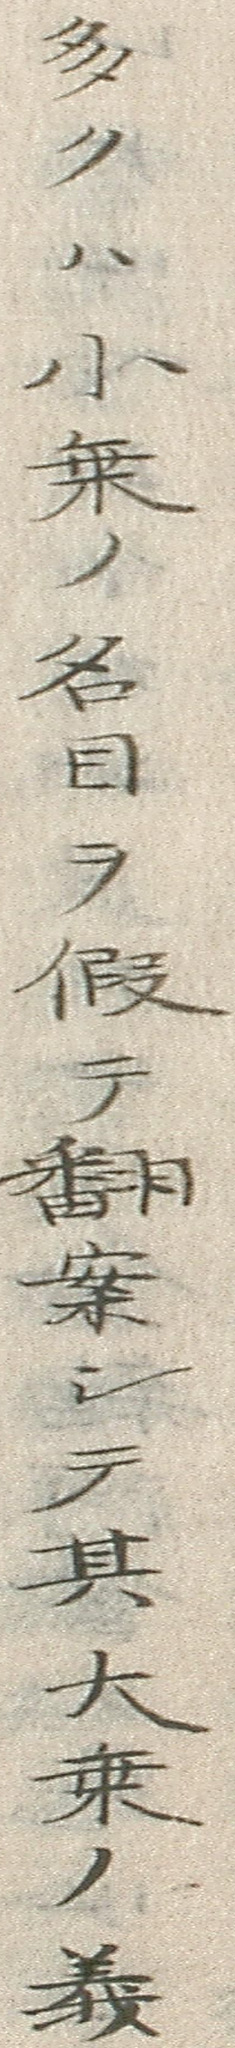多クハ小乗ノ名目ヲ仮テ翻案シテ其大乗ノ義
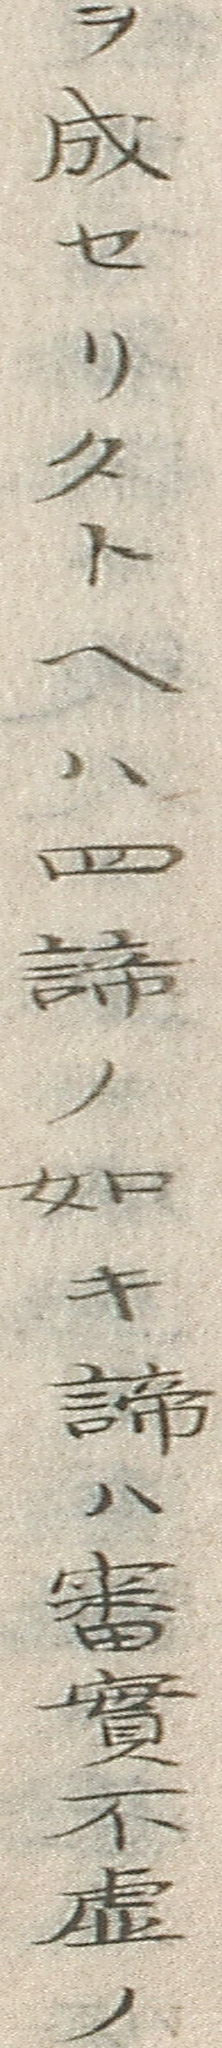ヲ成セリタトヘハ四諦ノ如キ諦ハ審実不虚ノ
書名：天學略名目羽翼　全
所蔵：東京大学地震研究所図書室 Earthquake Research Institute Library, The University of Tokyo, JAPAN
